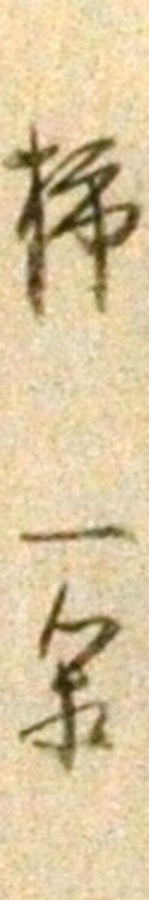柿一箱
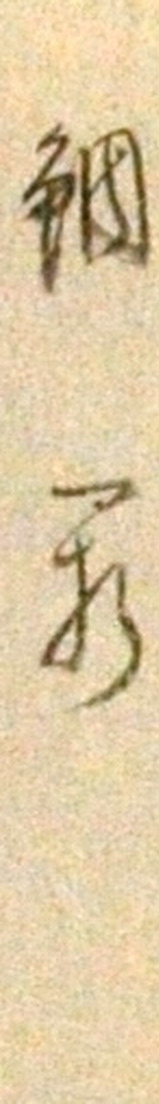鯛一折
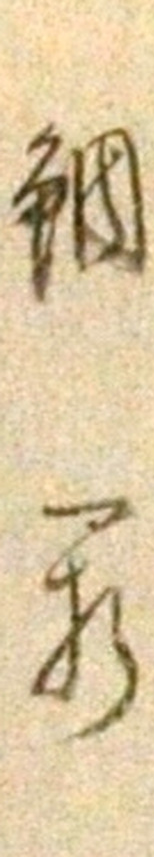鯛一折
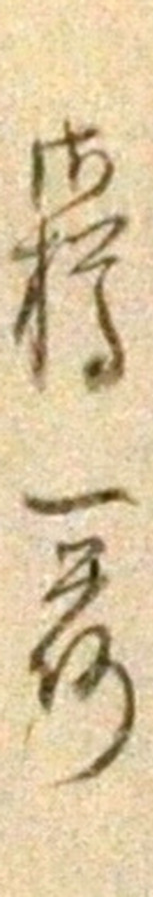御樽一荷
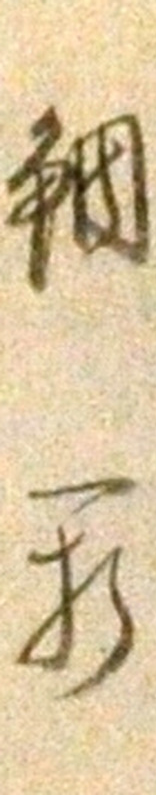鯛一折
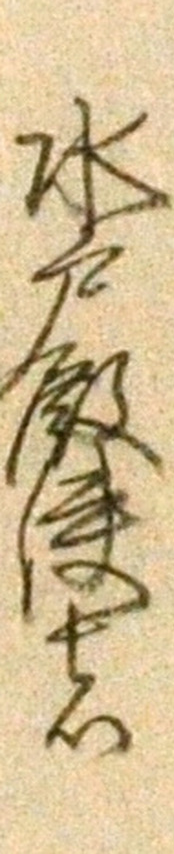水戸殿使者
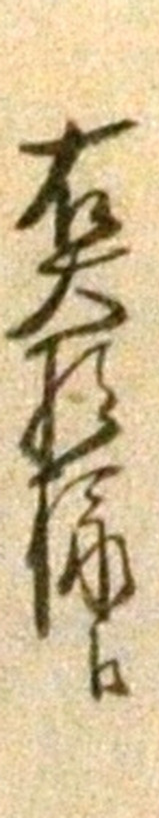右大将様え
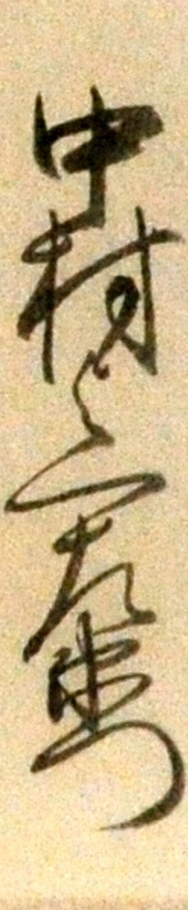中村与一左衛門
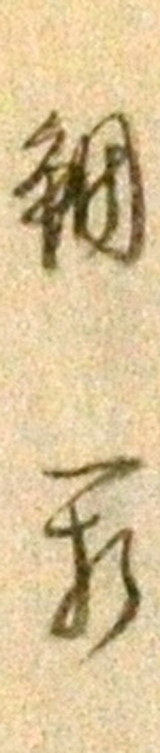鯛一折
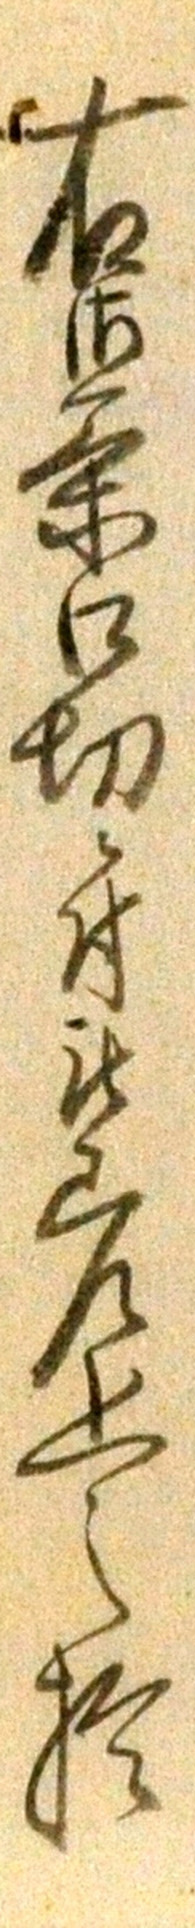右御茶口切ニ付被差上之於
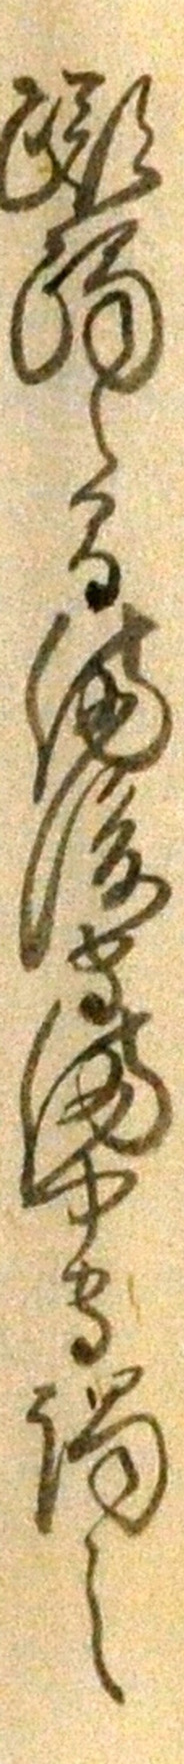躑躅之間備後守備中守謁之
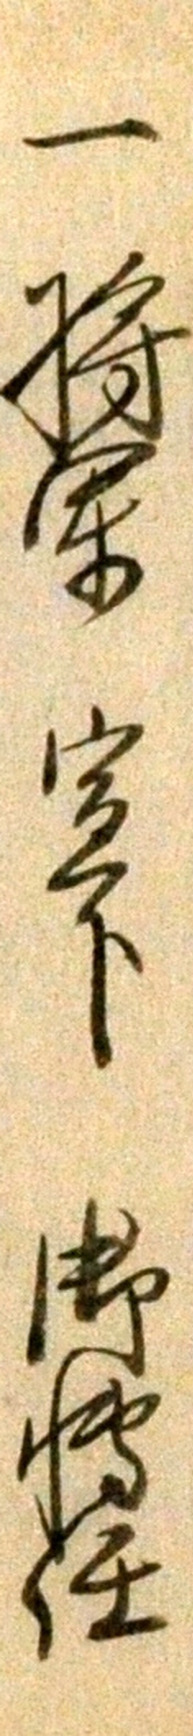一将軍宣下御転任
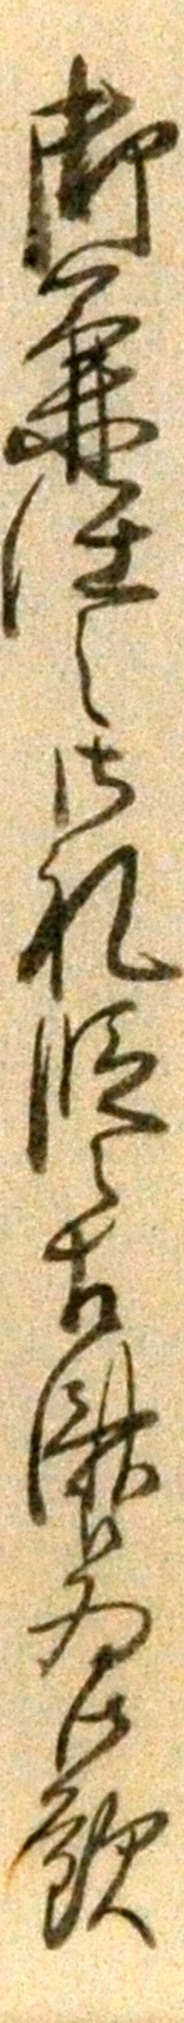御兼任之御礼段々相済候為御歓
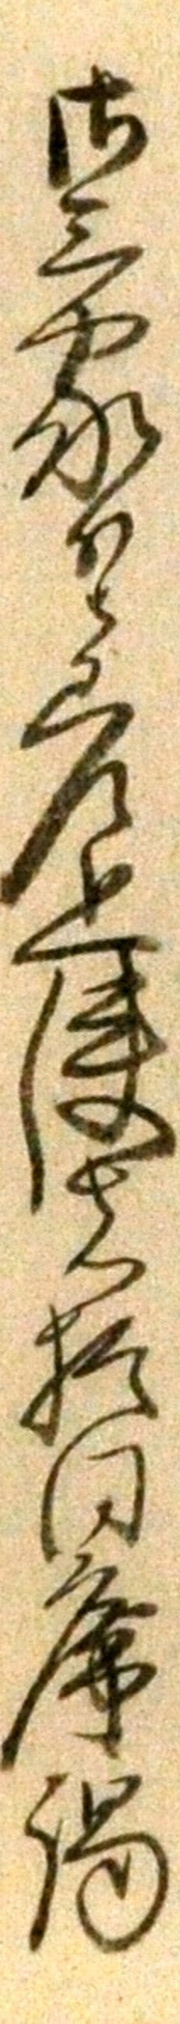御三家ゟ被差上使者於同席謁
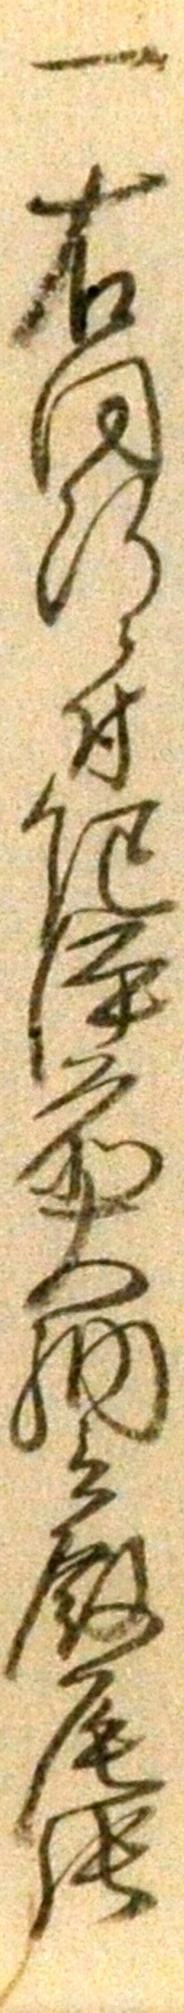一右同断ニ付紀伊前大納言殿尾張
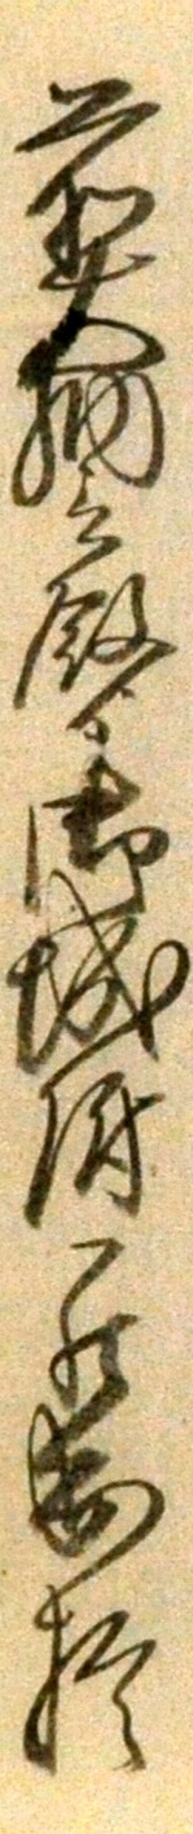前大納言殿ゟ御城附罷出於
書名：御馳走御能ノ節ノ留外
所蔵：伊那市立高遠町図書館・合同会社AMANE
